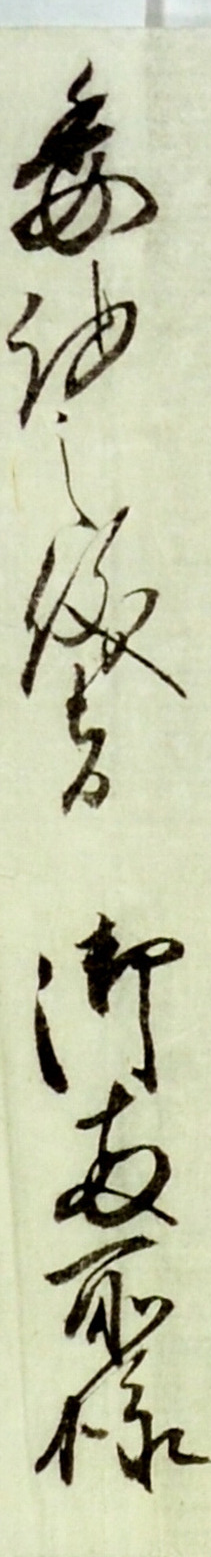委細之儀者御両所様

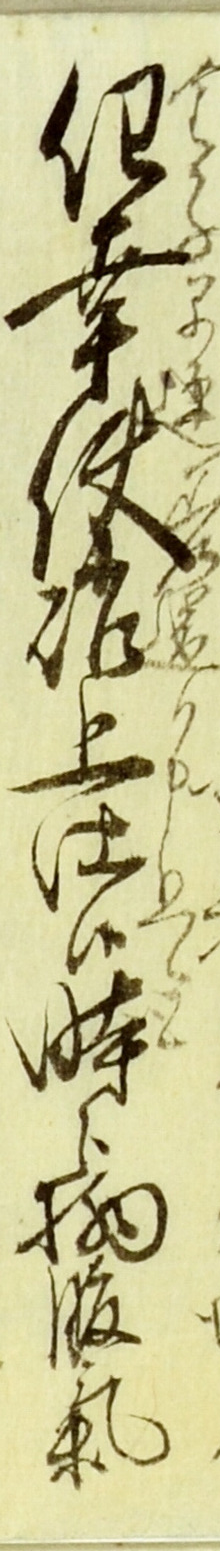任幸便啓上仕候時分柄暖気
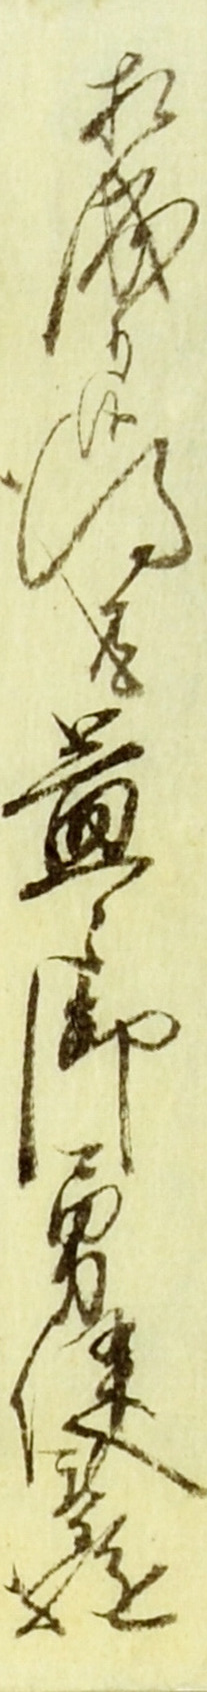相成り候得共益々御勇健被遊
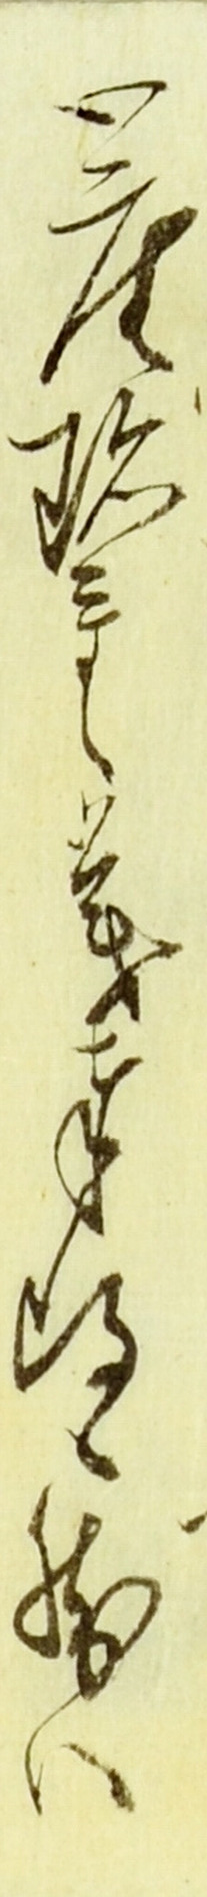御座珍重之御義奉存候然ハ
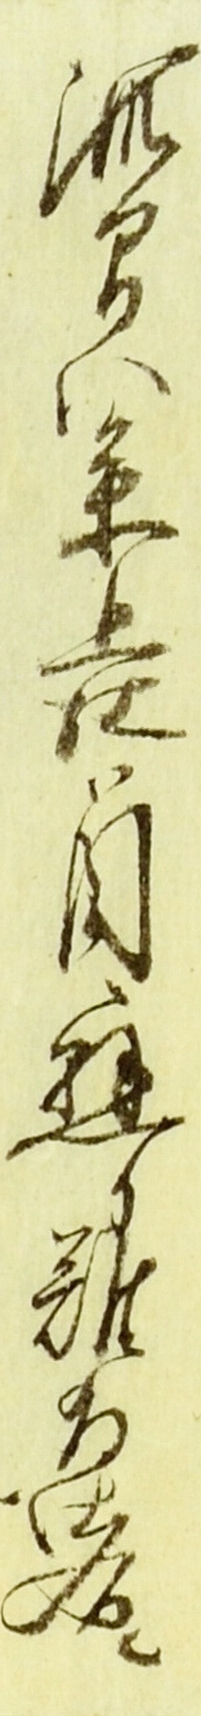此間ハ参上仕御目ニ懸り難有仕合ニ
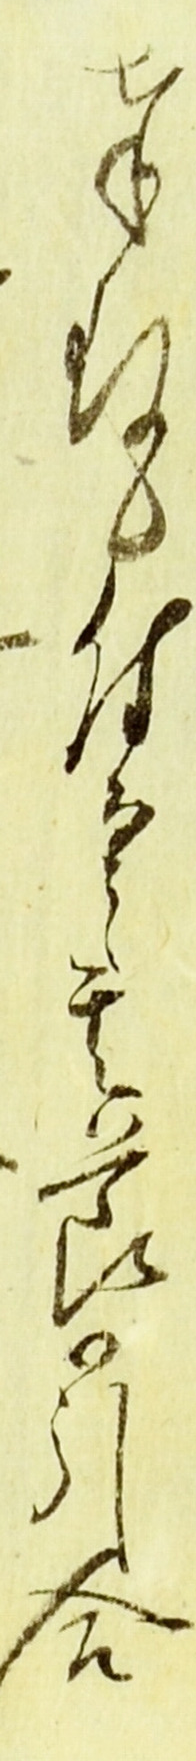奉存候付而者其節御引合
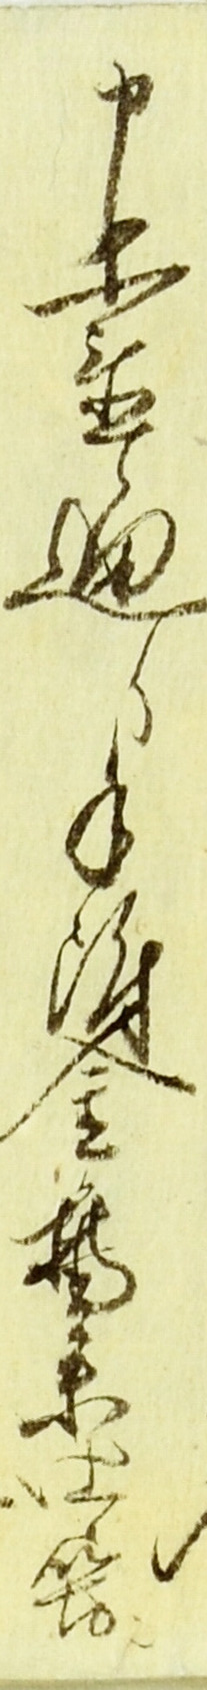申上置候通り手附金持参仕候筈
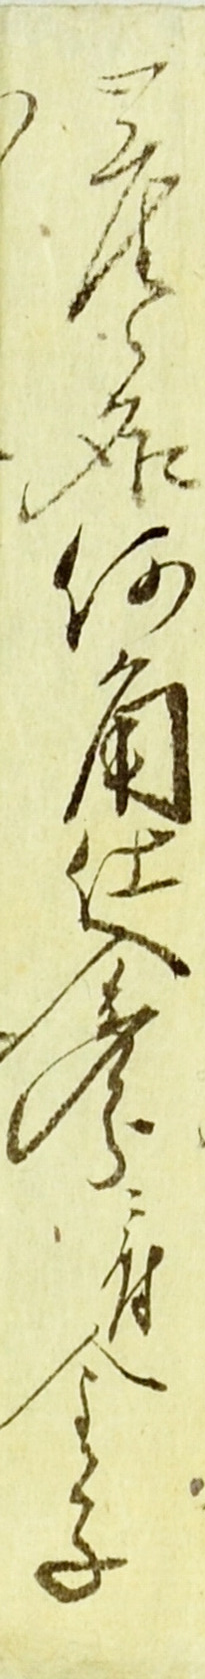御座候処何角仕入多分ニ付金子
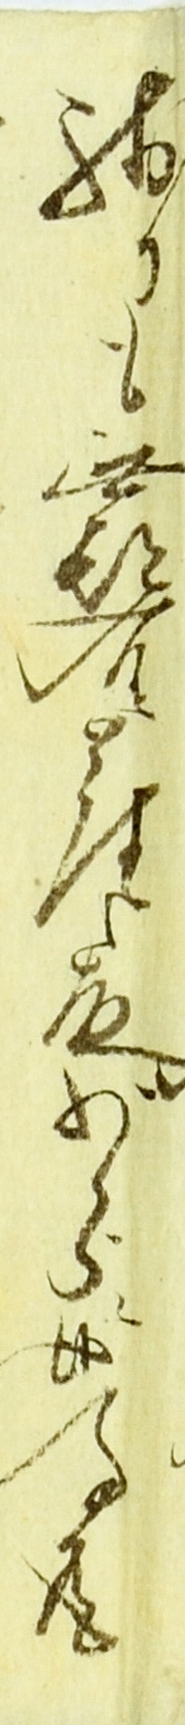残りも無都合ニ御座候故少分ニ候得共
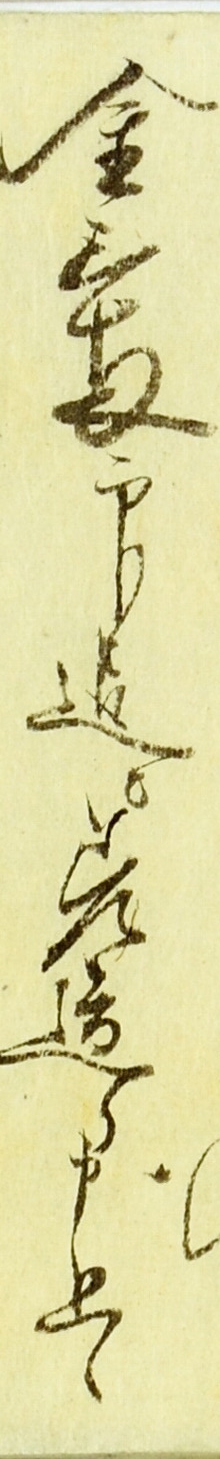金三両印迄ニ差送り申上候
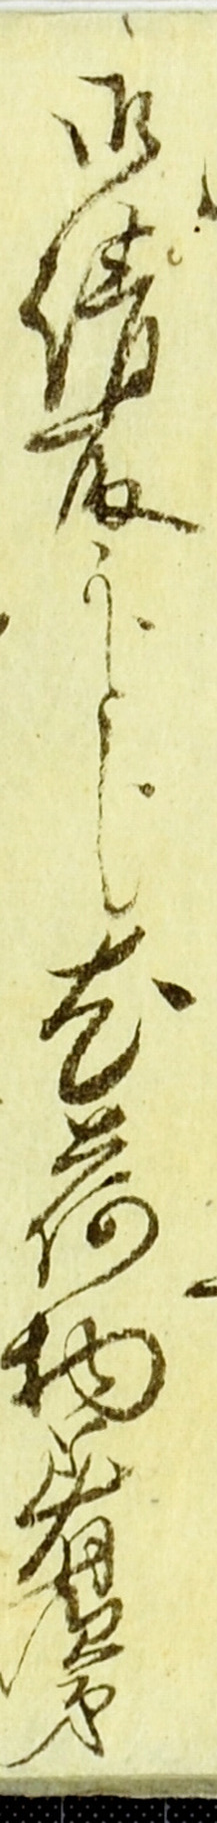御請取可被下候尤荷物着次第
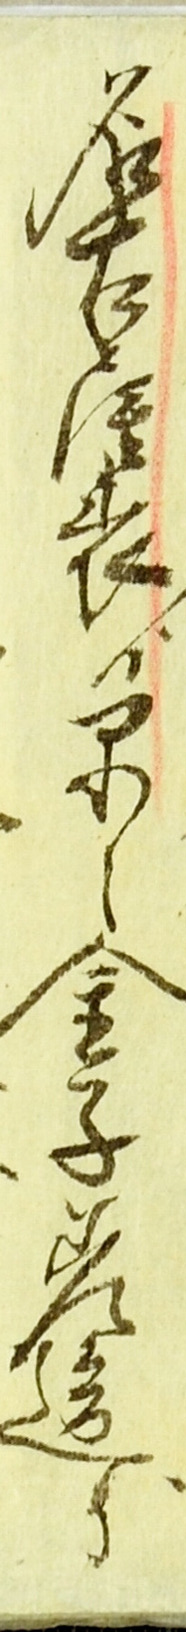名古屋表ゟ早々金子差送り
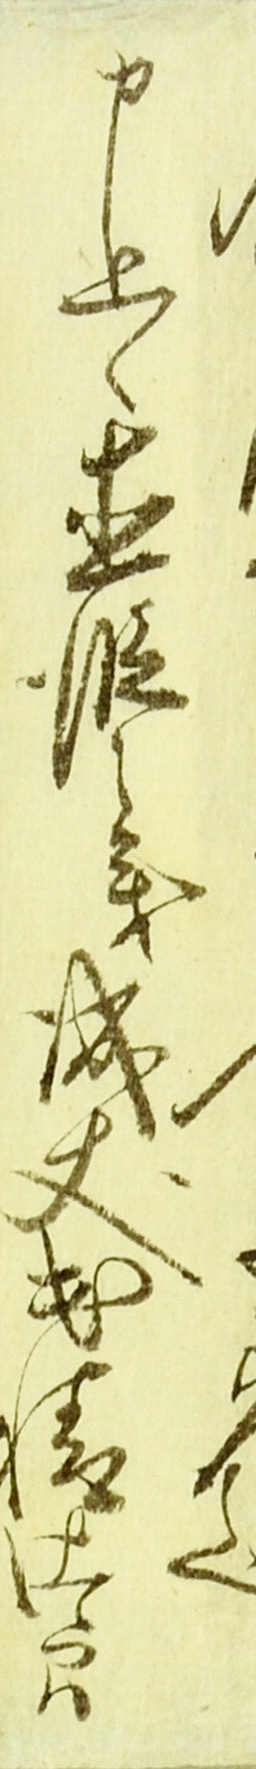申上候直段之義成丈出情仕候間
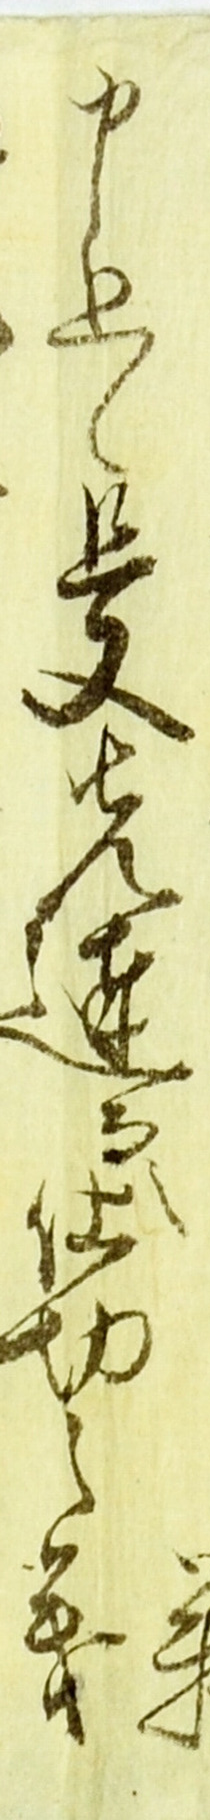申上候且又先達而仕切之義
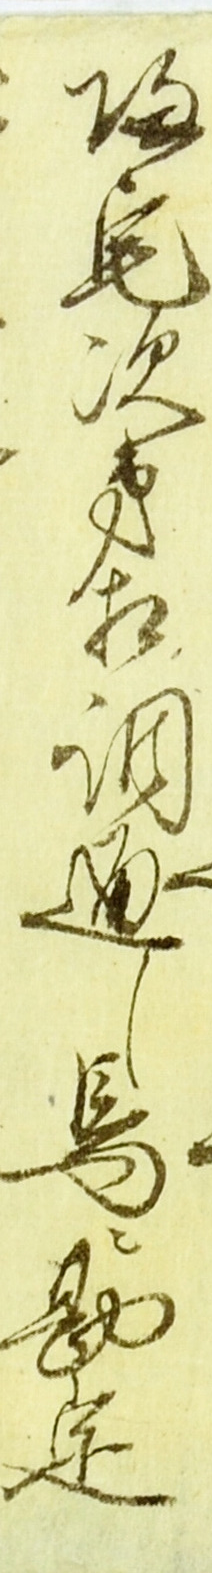帰宅次第相調通し馬ニ勘定
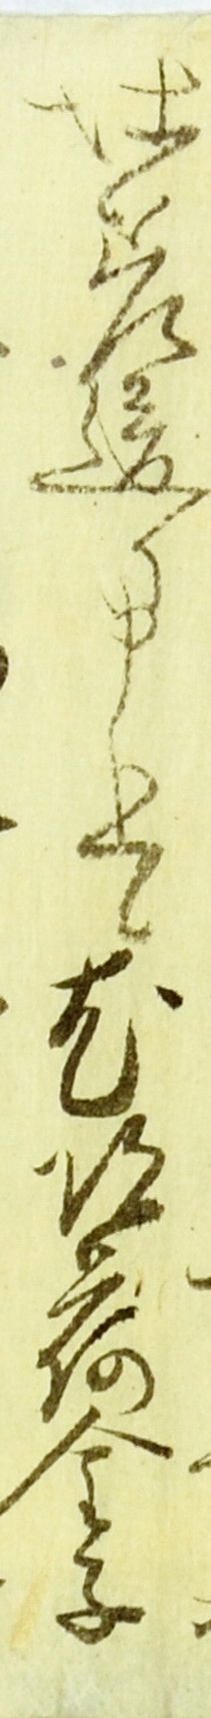仕差送り申上候尤跡荷金子
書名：書状
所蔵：伊那市立高遠町図書館・合同会社AMANE
